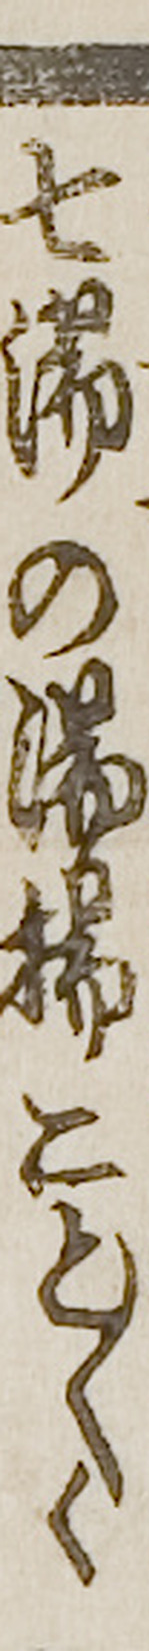七湯の湯揚ことことく
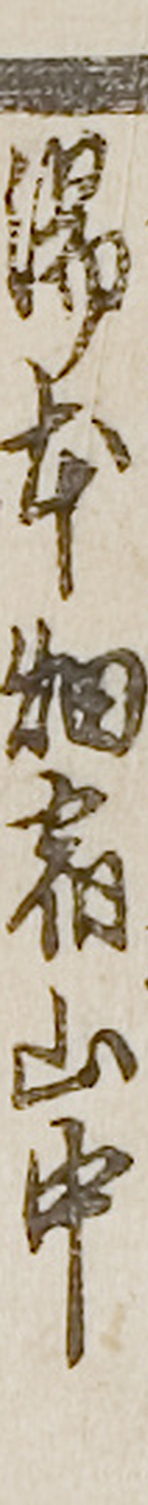湯本畑宿山中
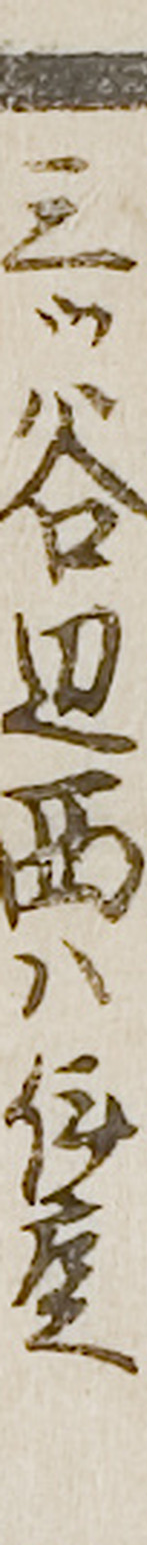三ツ谷辺西ハ伊豆
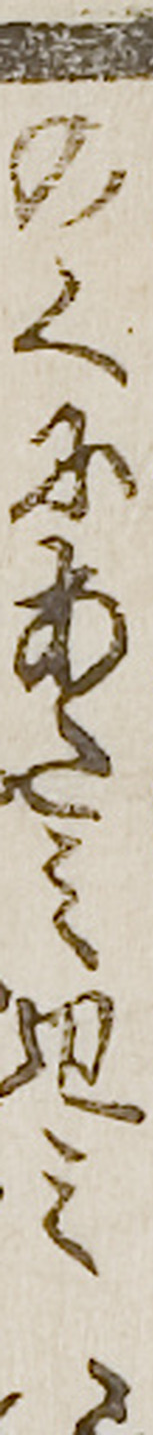のくにあたみ辺み
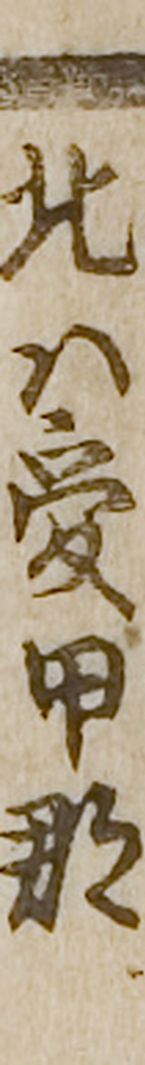北ハ愛甲郡
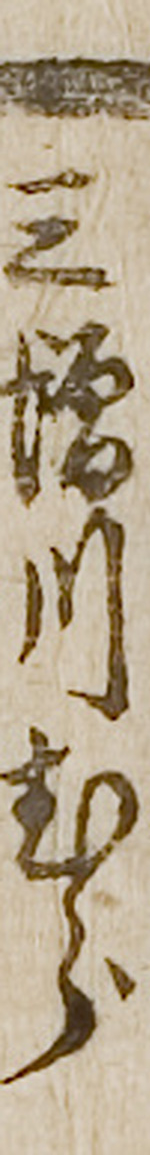三増川むら
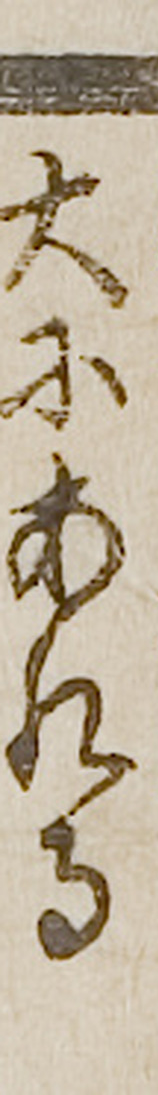大にあれる
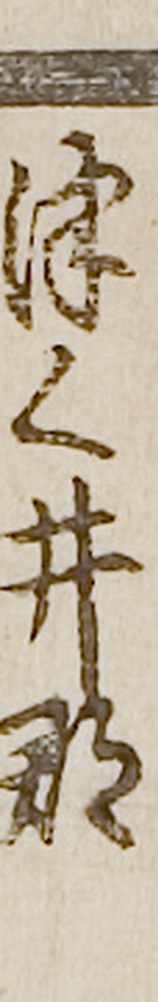津く井郡
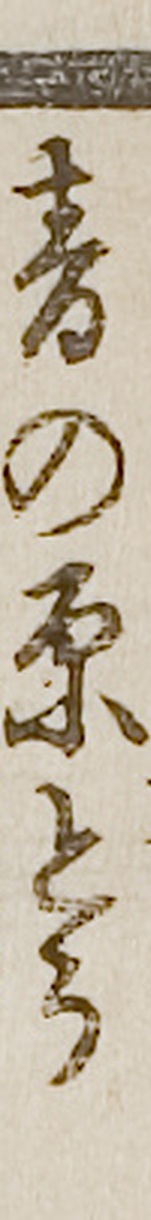青の原とう
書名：相模国大地震
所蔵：東京大学総合図書館 General Library in the University of Tokyo, JAPAN
